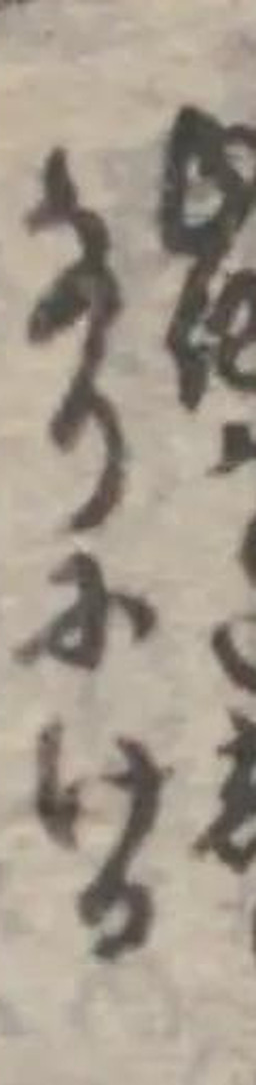なりにける
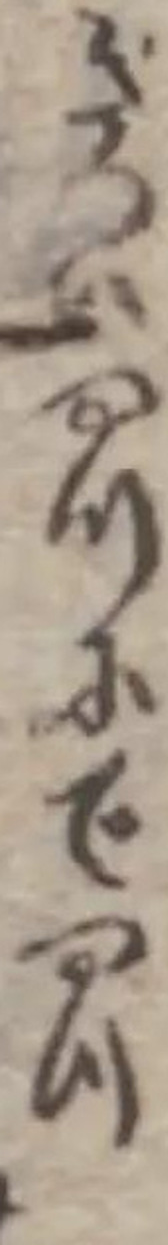きついやつにでやつ
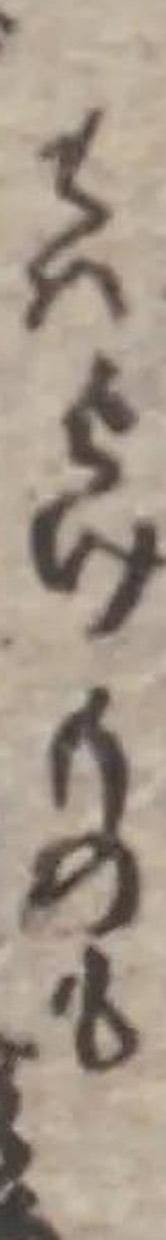てははけものも
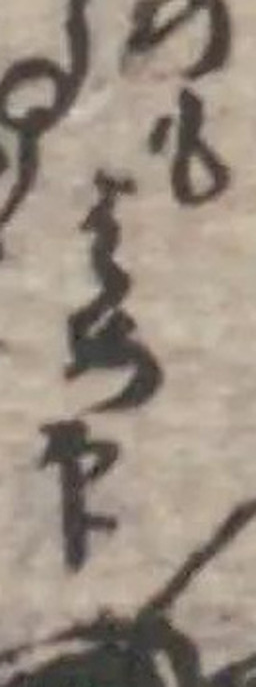はめ印
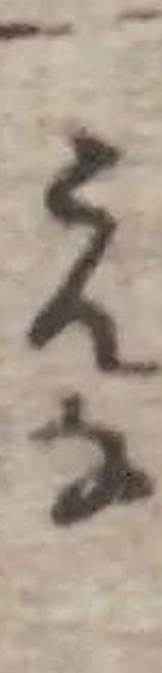こんな
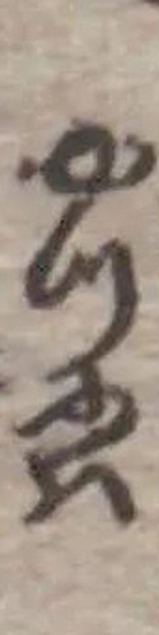やつには
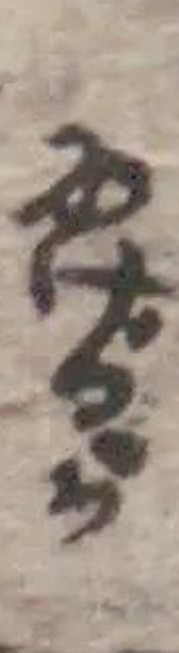にげるが

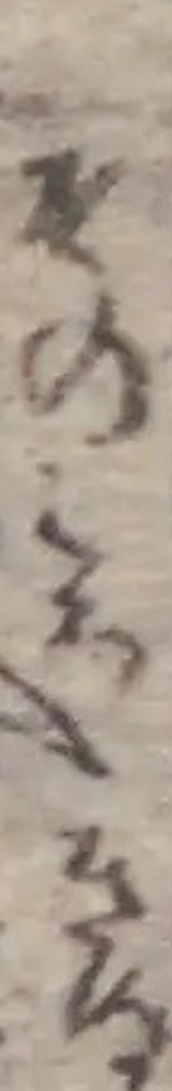そのころきぬや
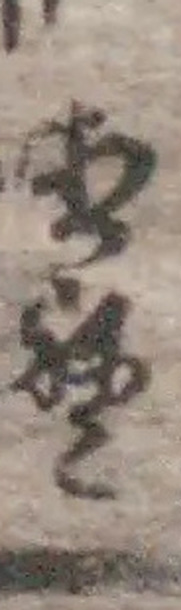あかねこ
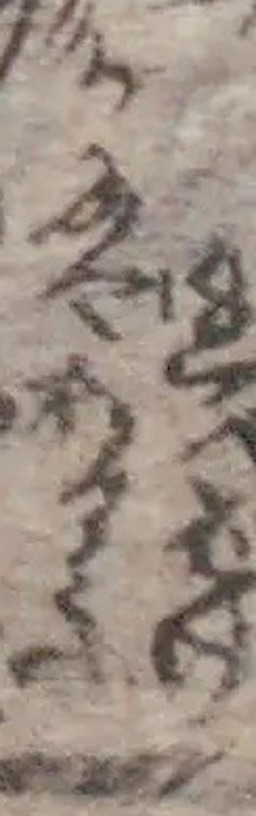かにやあァ
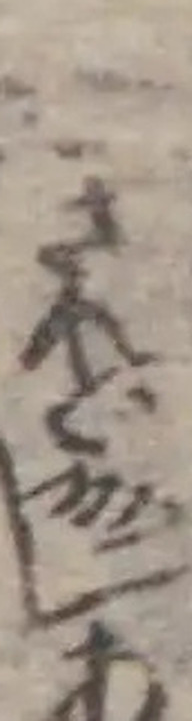きんどあり
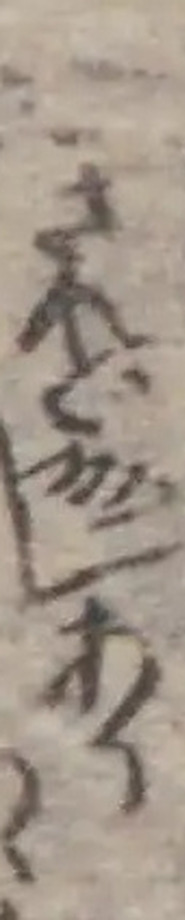きんどあり
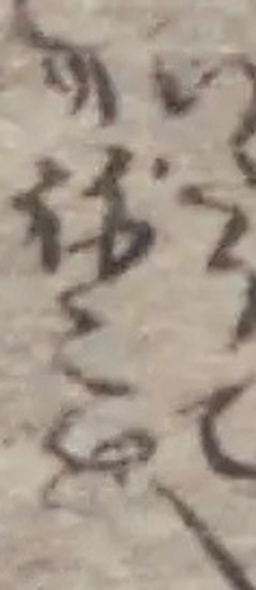ねこを
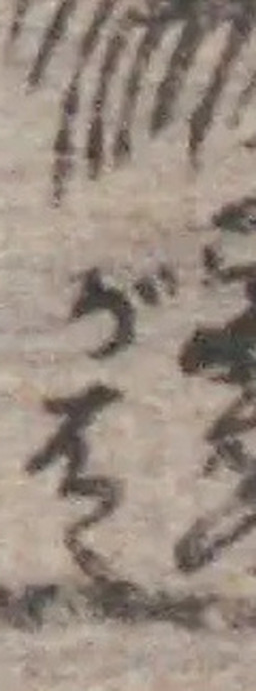がはゝ
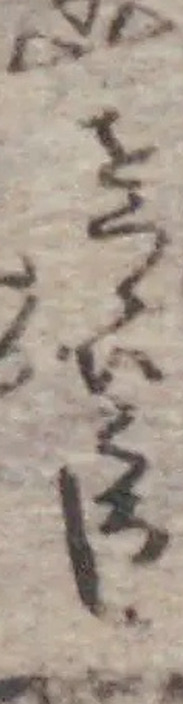をくらいころし
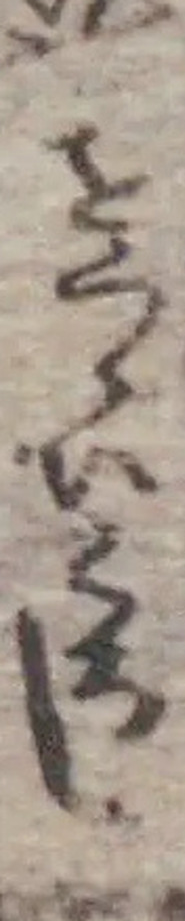をくらいころし
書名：鎌田又八 2巻
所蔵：国立国会図書館 National Diet Library, JAPAN
